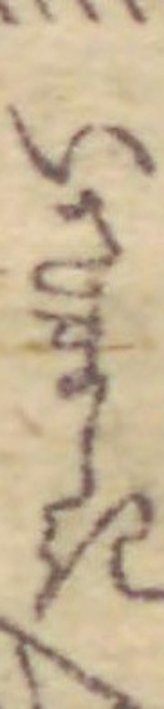いさましき
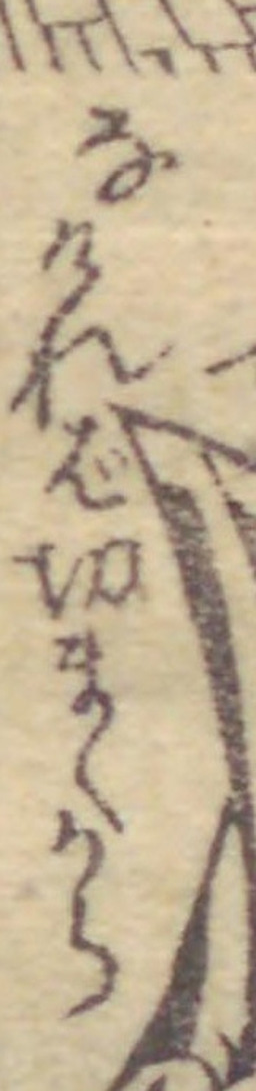なければ切りまくから
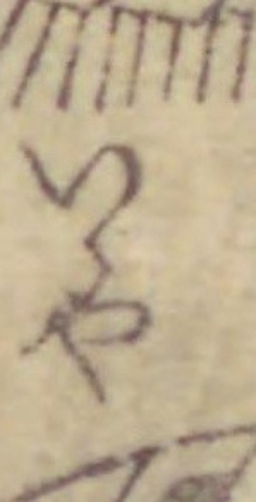いゝや
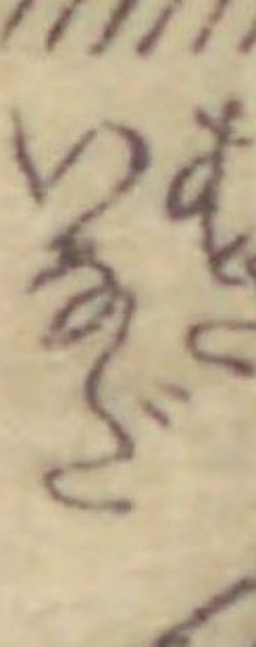いなだ
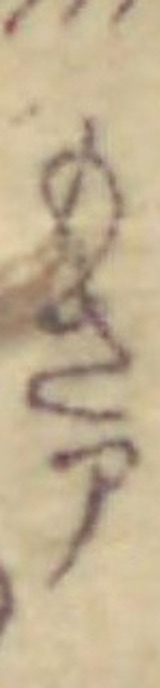もさァ
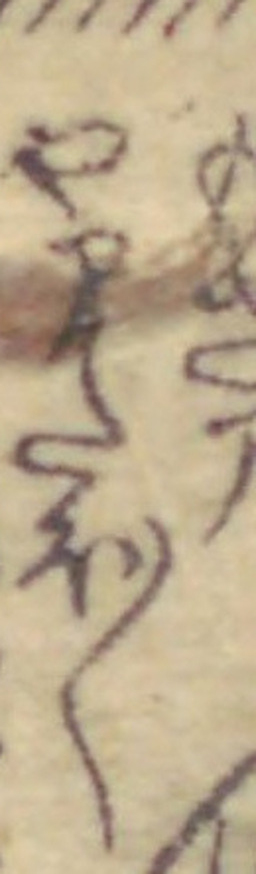ヤアたほ〳〵
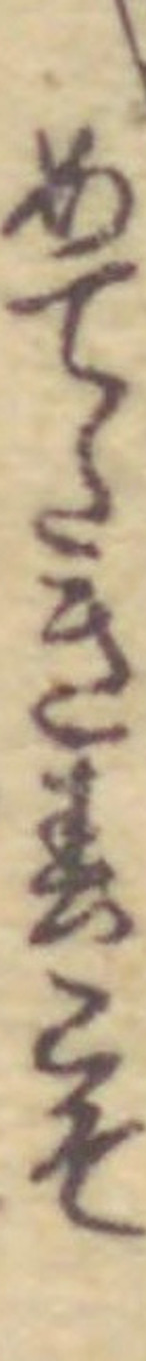めてたき春こそ
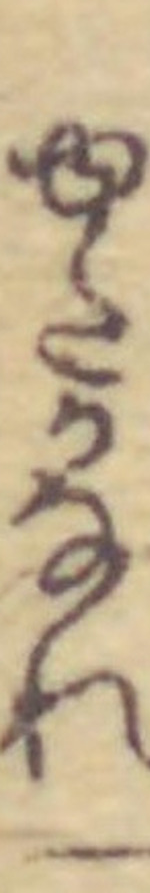ゆたかなれ
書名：朝比奈草摺実記 2巻
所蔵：国立国会図書館 National Diet Library, JAPAN
